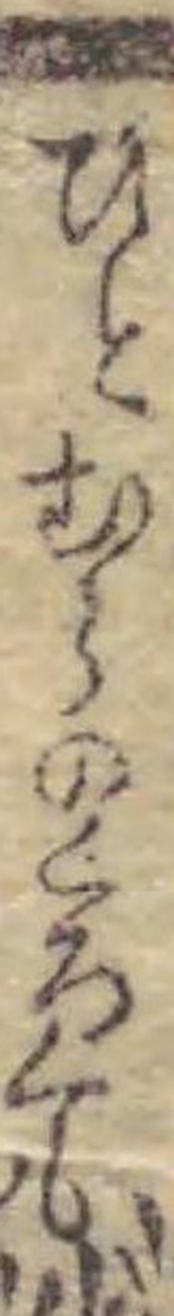ひとむらのくろくも
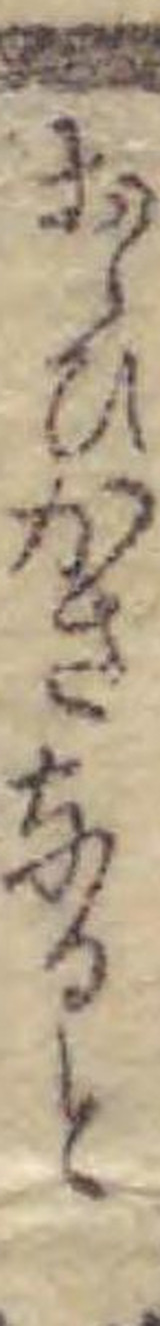おゝひかさなると
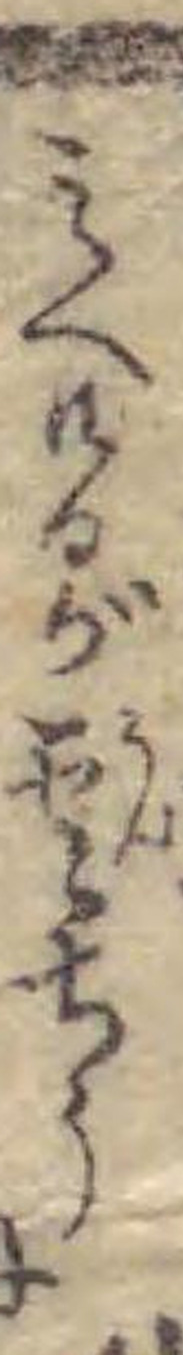みへけるが雲ちうに
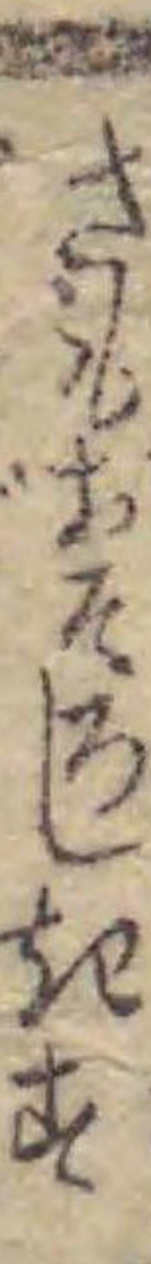さもおそろしきす
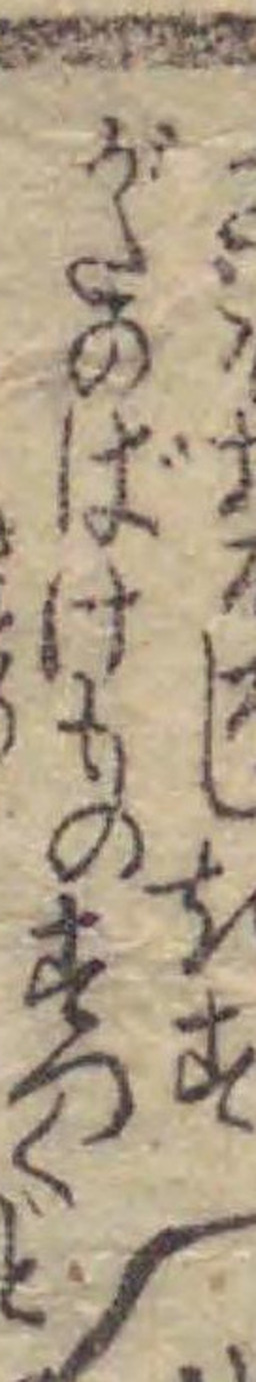がたのばけものすつくと
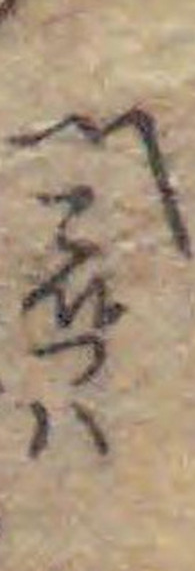〽こいつは
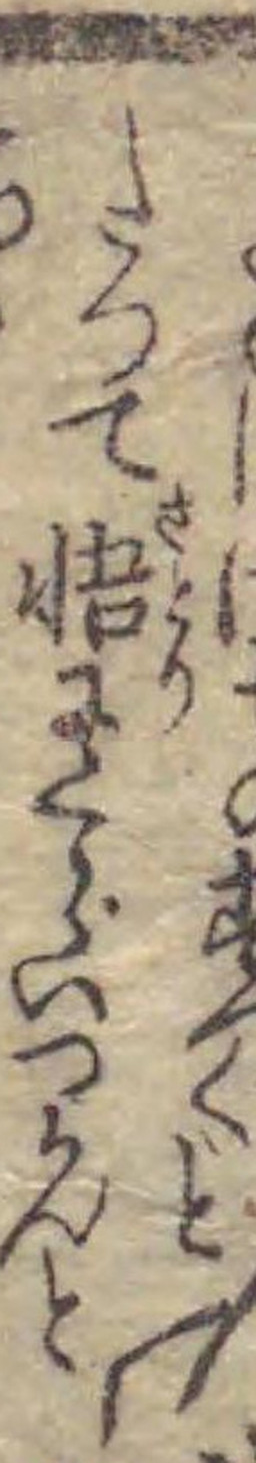たつて悟にくらいつかんと
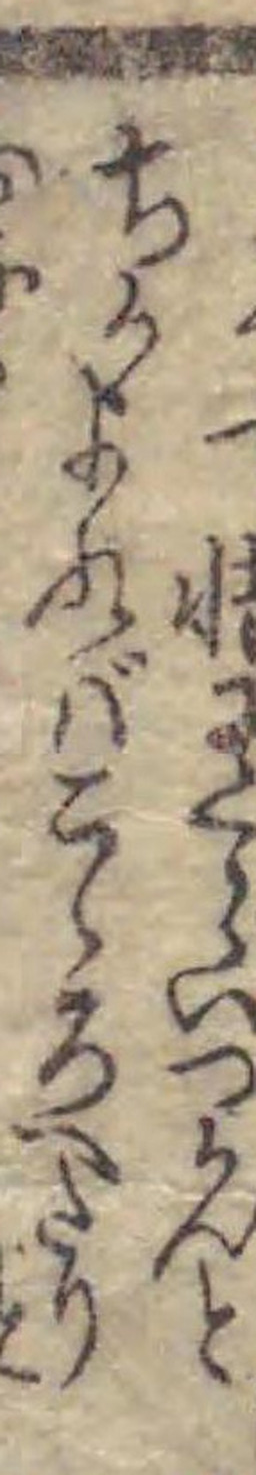ちかよればこゝろへたりと
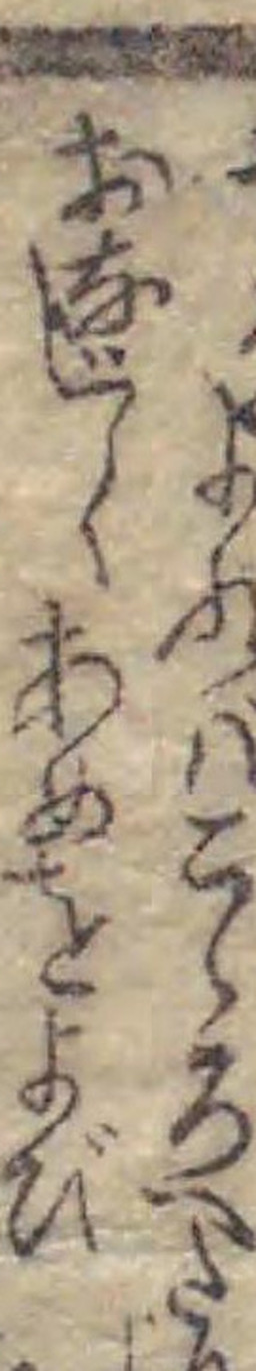おなじくあめをよび
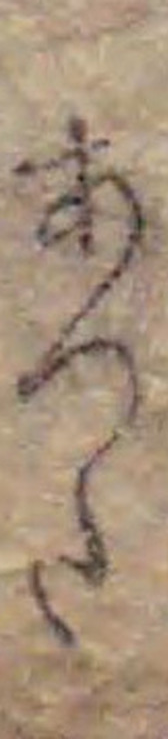あつた
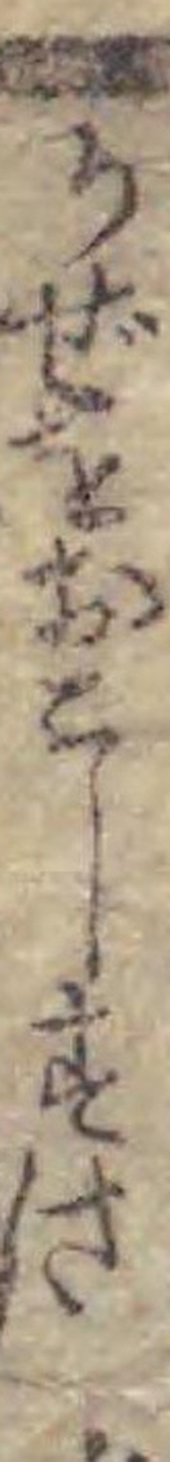かぜをおこしすさ
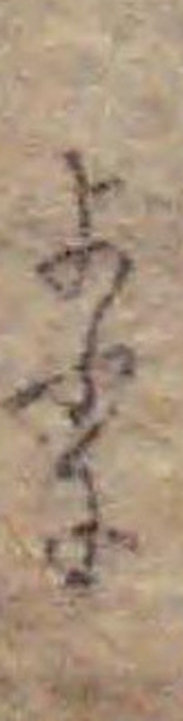よふに
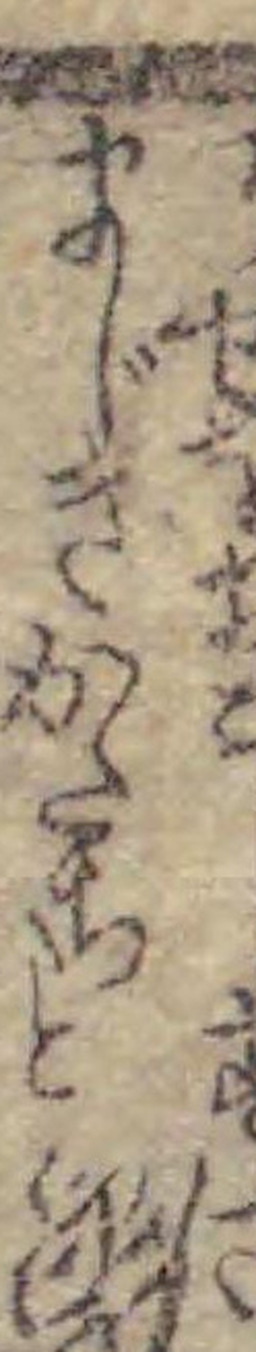まじきかたちと
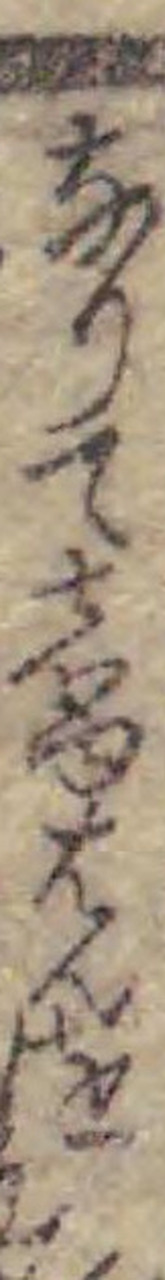なりてしゆはんを
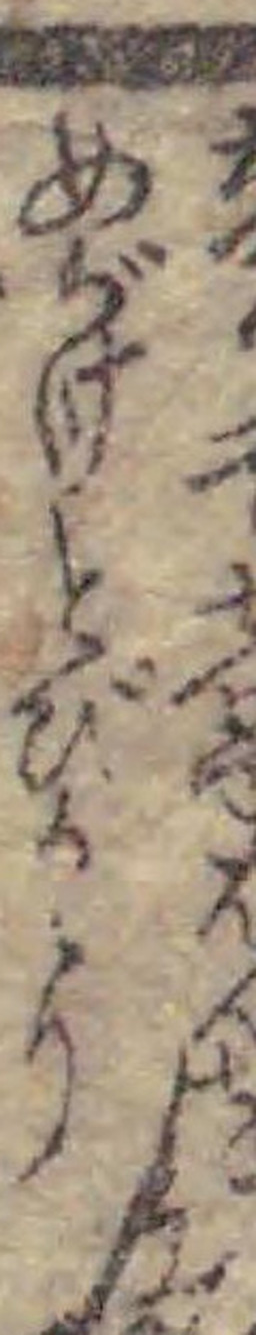めがけとびかゝり
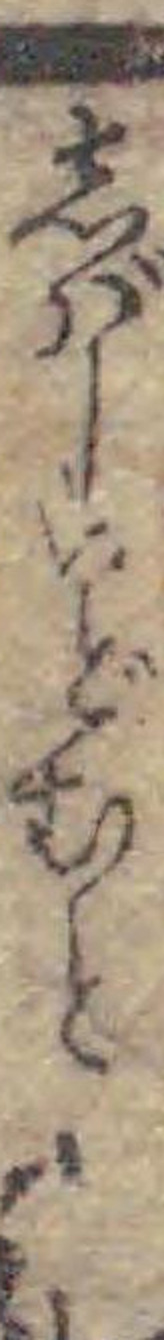しばしいどむと
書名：化物世界夜半嵐 : 3巻
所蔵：国立国会図書館 National Diet Library, JAPAN
